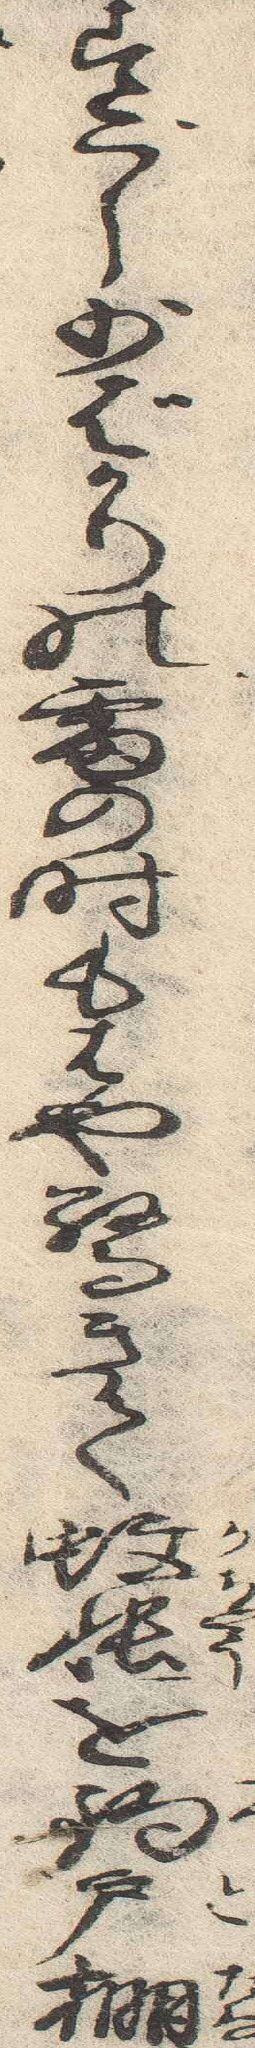すごし少ばかりの雷の時もはや驚きて蚊帳を釣戸棚
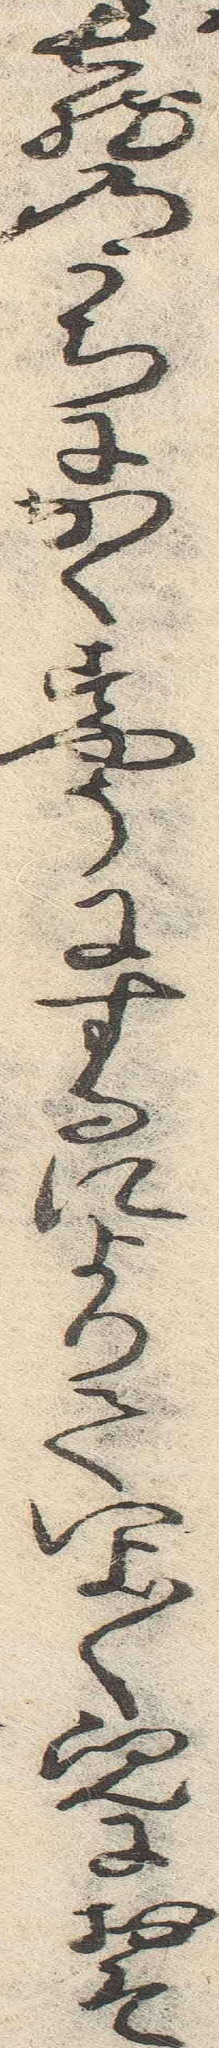長持のうちにかくすやうにするによりていよ〳〵児におそ
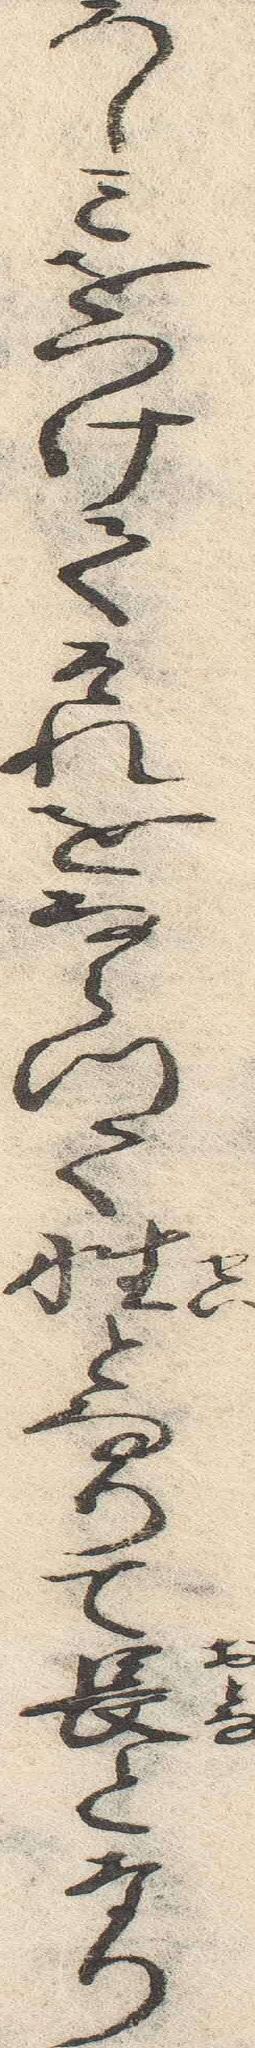ろしみをつけてそれをならつて性となりて長となり
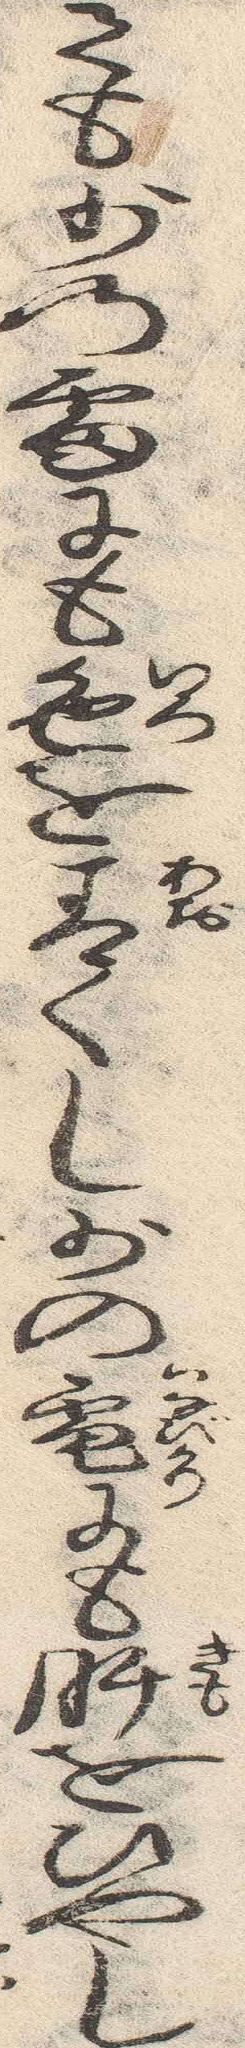ても少の雷にも色を青くし少の電にも肝をひやし
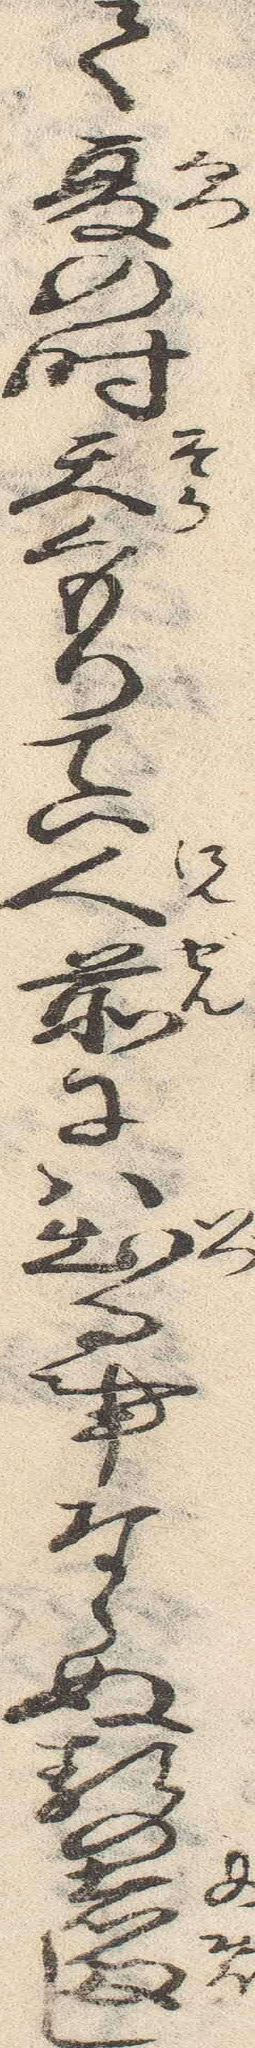て夏の時天くもりては人前には出る事ならぬ類の者多し
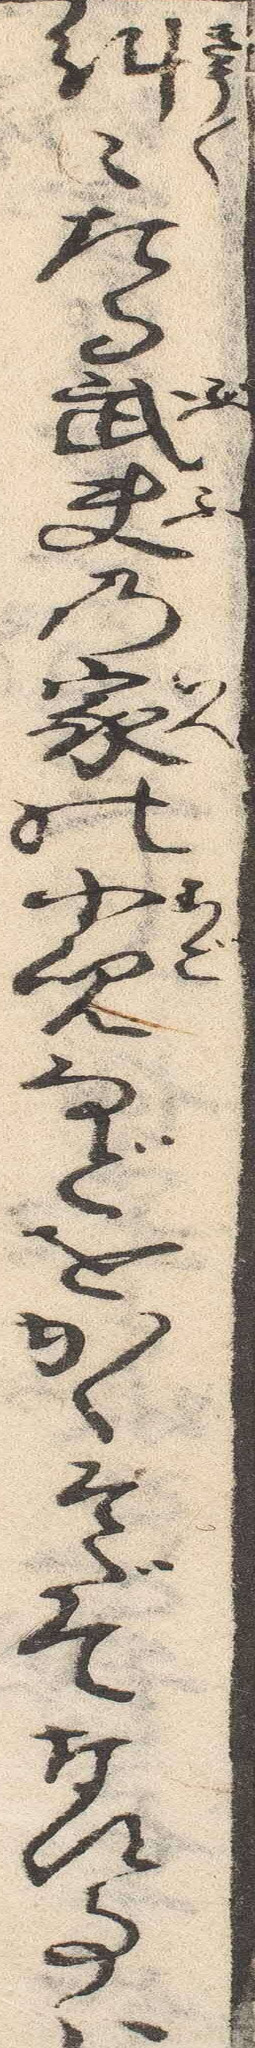糾〻たる武夫の家の小児などをかくそだてなす事は
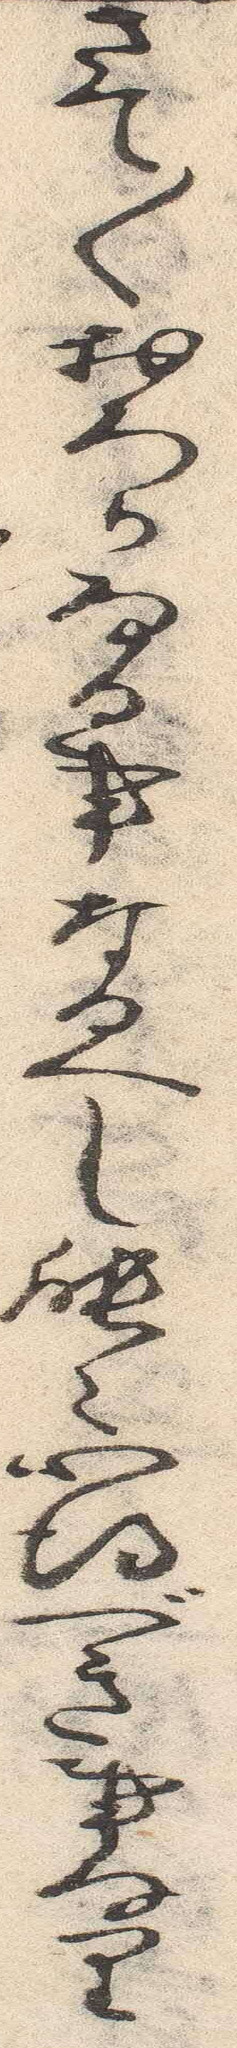さて〳〵おろかなる事なるへし能〻心得べき事なり
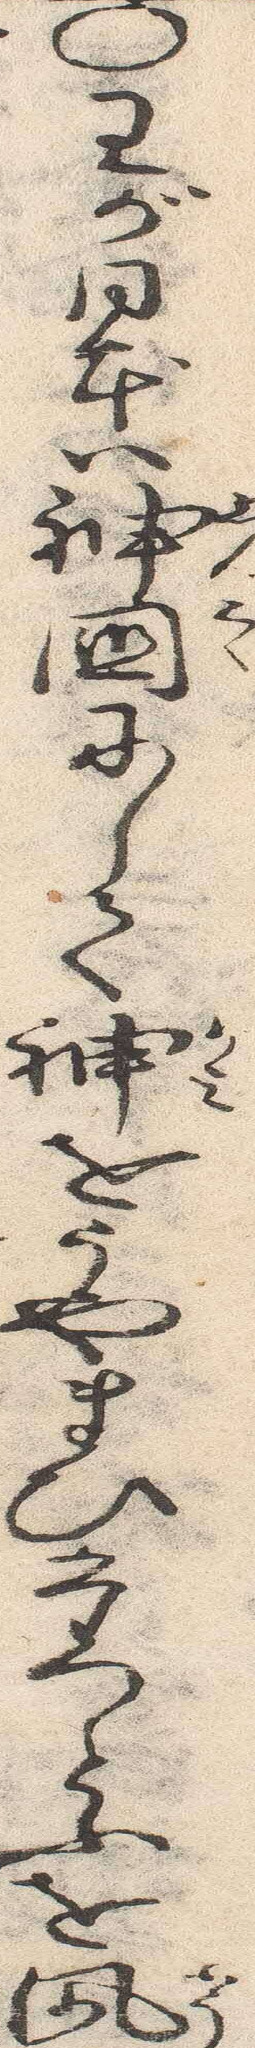○わが日本は神國にして神をうやまひたつとふを風
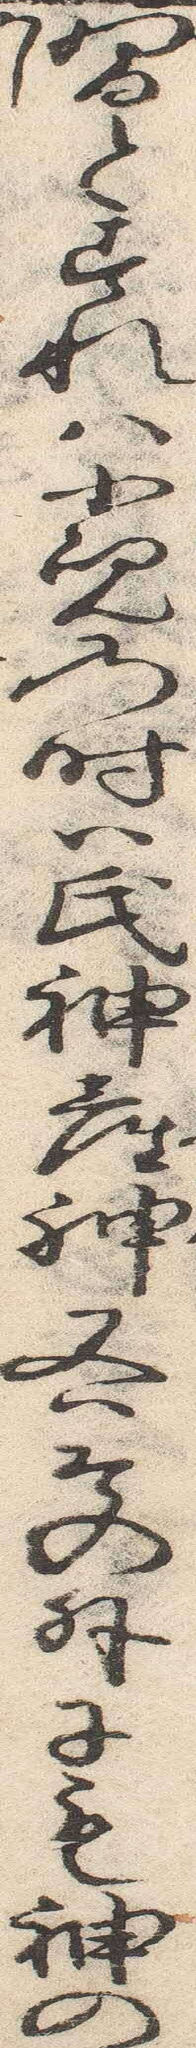習とすれは小児の時は氏神産神又はその外にも神の
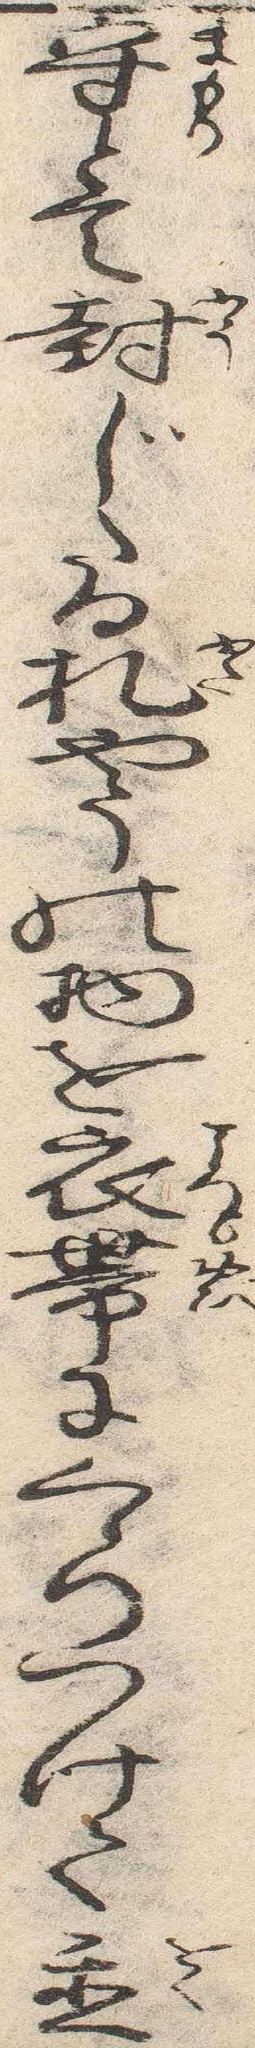守とて封じたる札やうの物を衣帯にくゝりつけて置
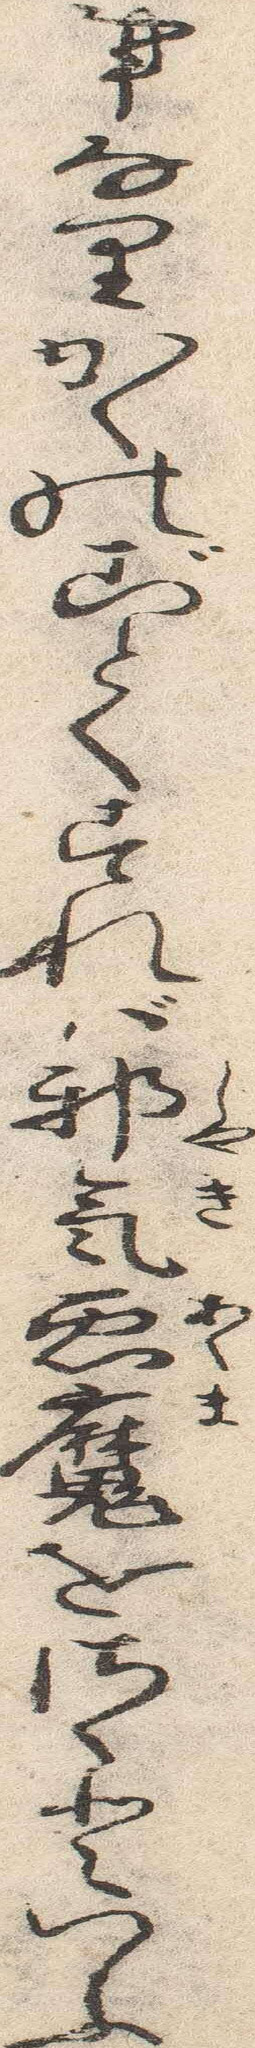事なりかくのごとくすれば邪気悪魔をさくといふ
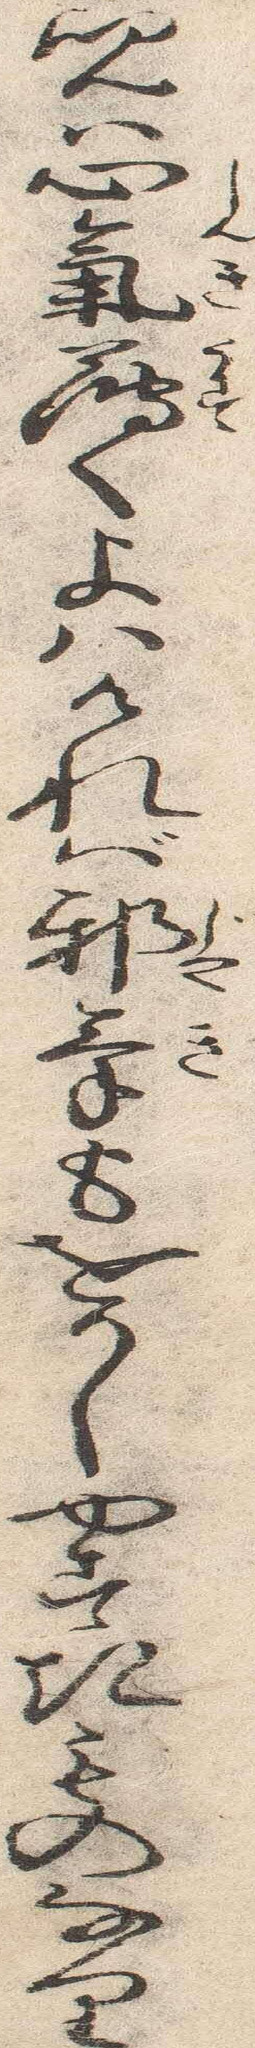児は心氣薄くよはければ邪気もをかしやすきものなり
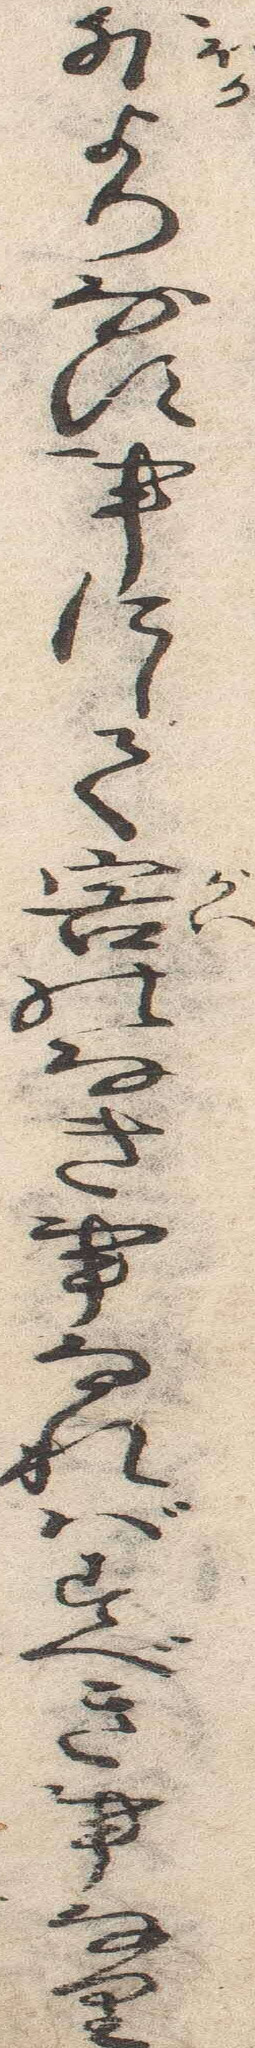外よりなす事にして害のなき事なればすべき事なり
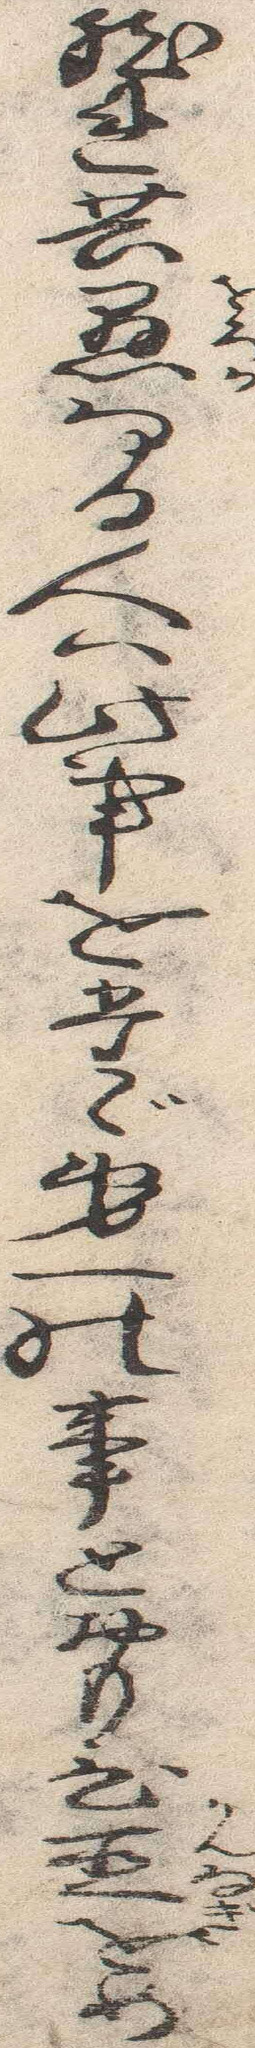然れ共愚なる人は此事をたゞ㐧一の事とおもひ巫をめ
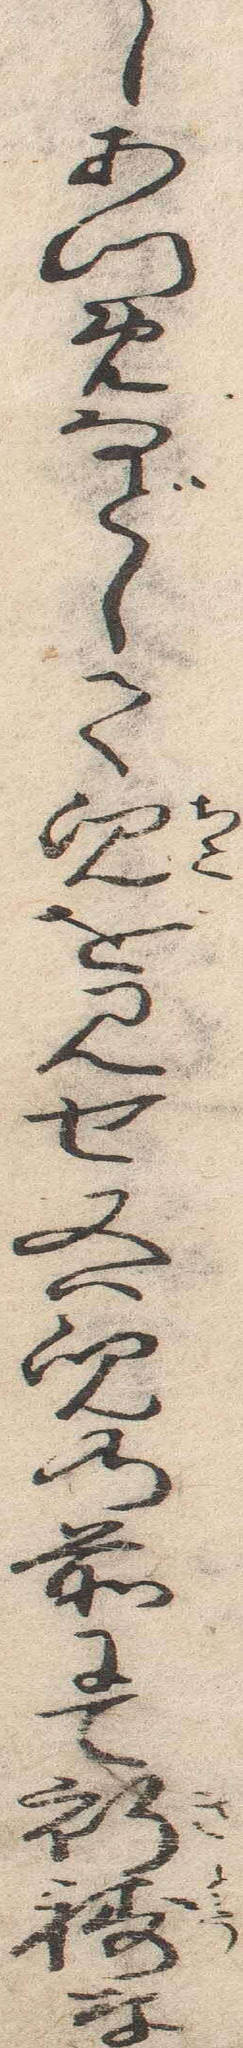しあつめなどして児を見せ又は児の前にて祈祷な
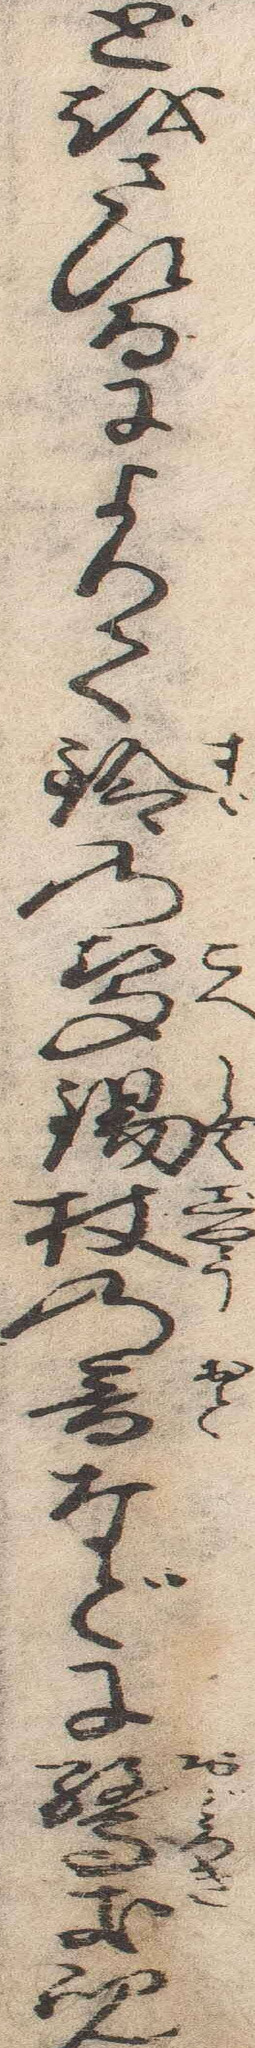どをさするによりて鈴の聲錫杖の音などに驚き児
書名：小児必用養育草
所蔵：東京学芸大学附属図書館 国文学研究資料館
